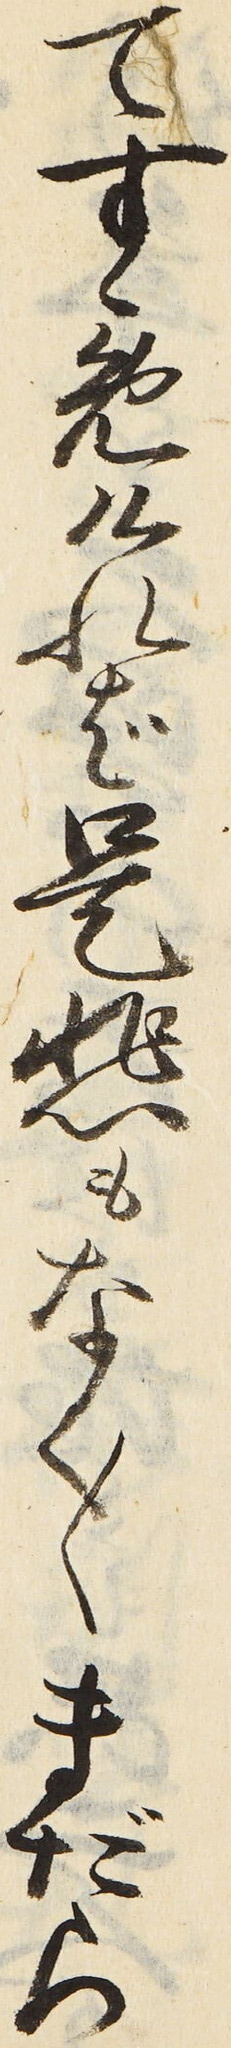てすゝめければ是悲もなく〳〵まだら
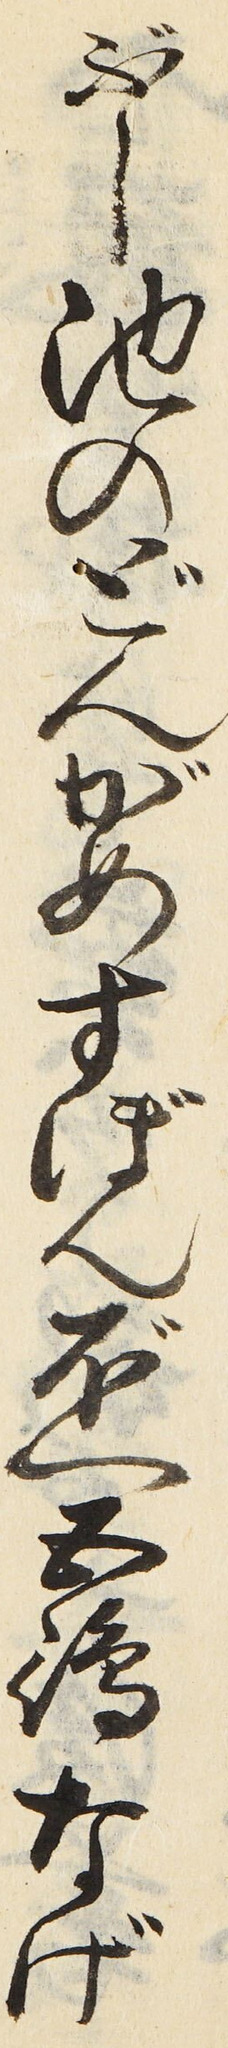ぶし池のどんがめすぼんぶへ五嶋なげ
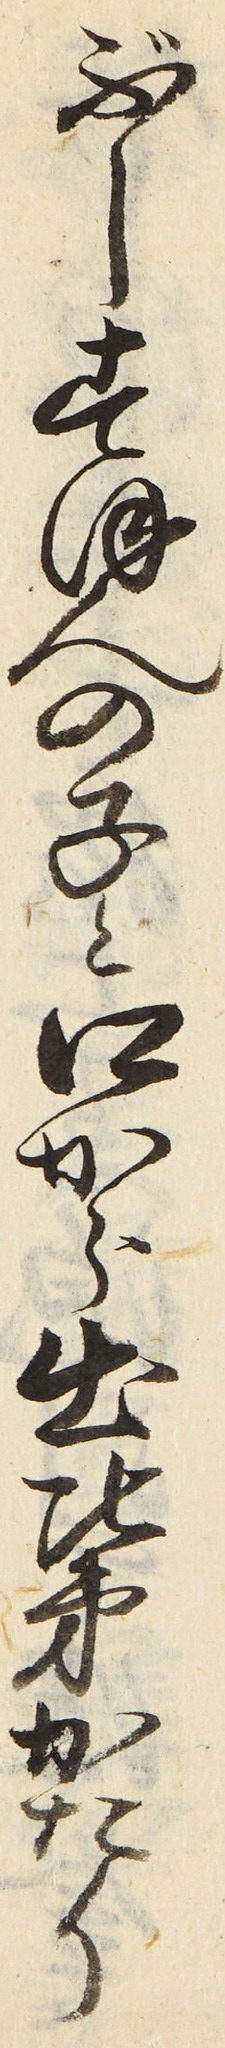ぶしすほんの子と口から出次第かたり
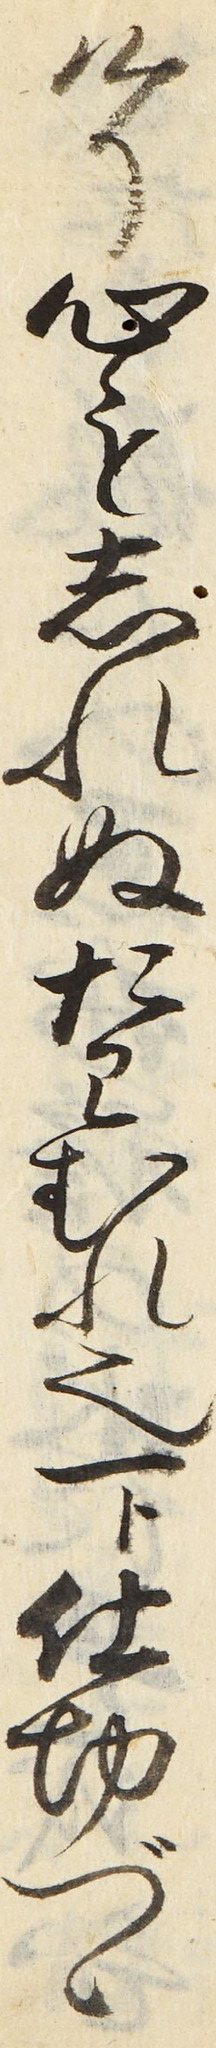けり心もしれぬたわむれ也一と仕切づゝ
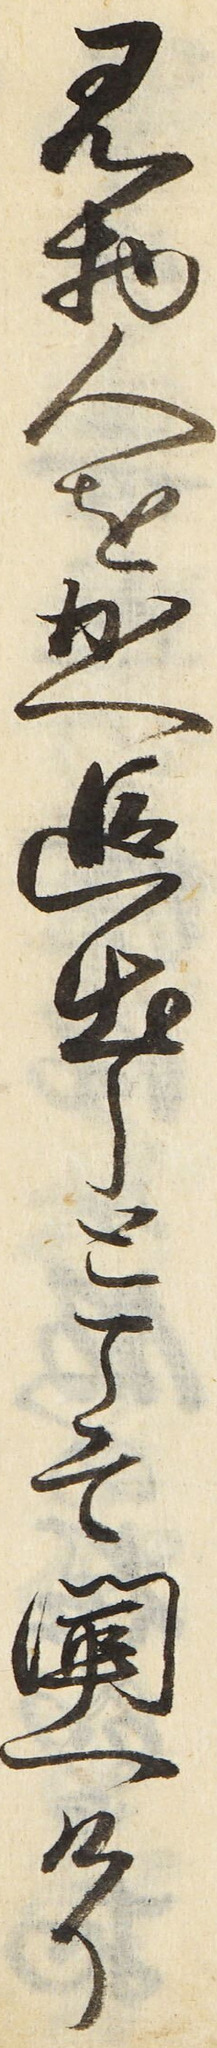見物人をかへ追出しとこそ聞へけり
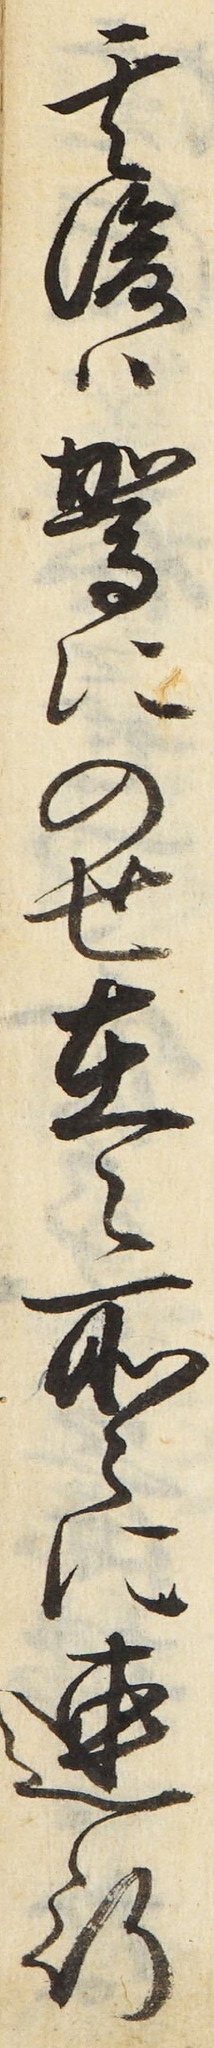其後は駕にのせ在々所々に連行

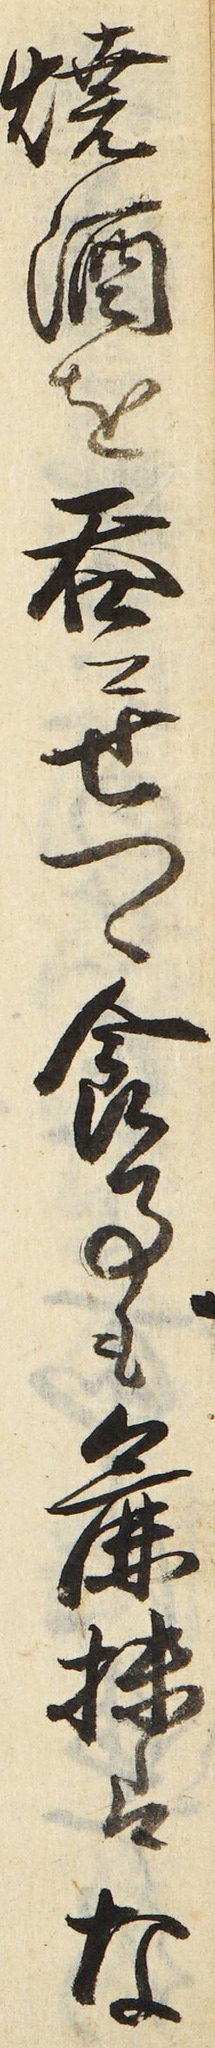焼酒を呑ませつゝ食事も麁抹はな
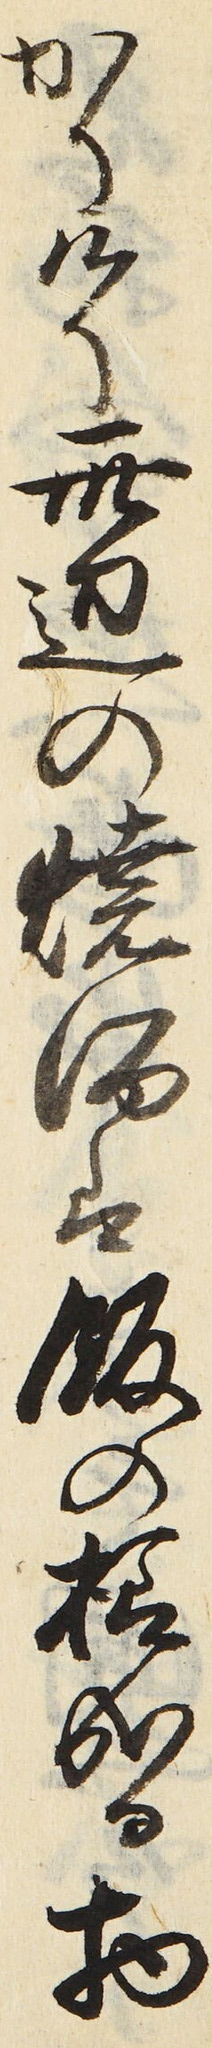かりけり此辺の焼酒は飯の様成る物
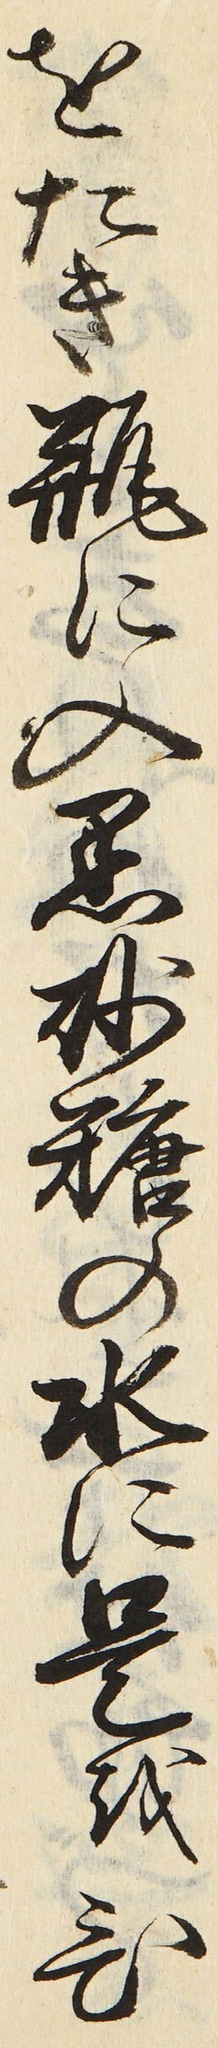をたき瓶に入黒砂糖の水に是をひ
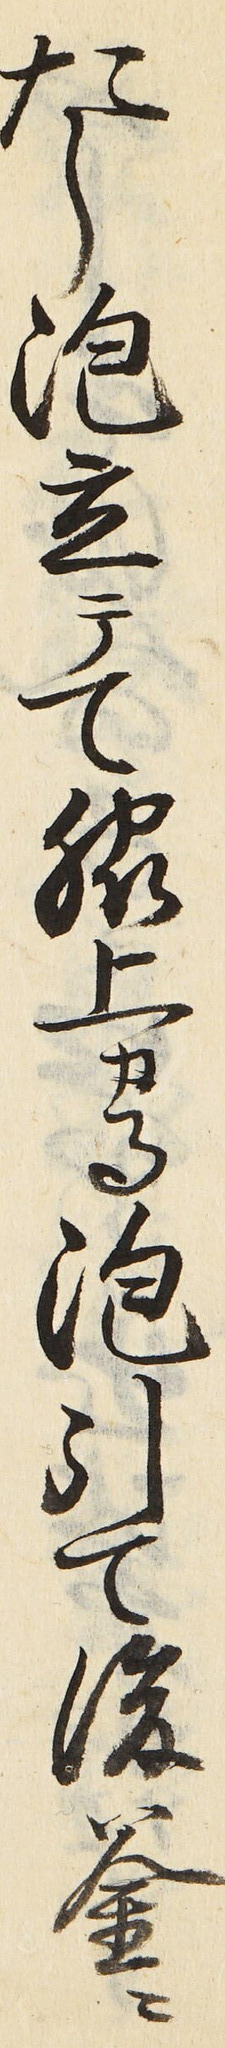たし泡立てて脇上かる泡引て後釜に
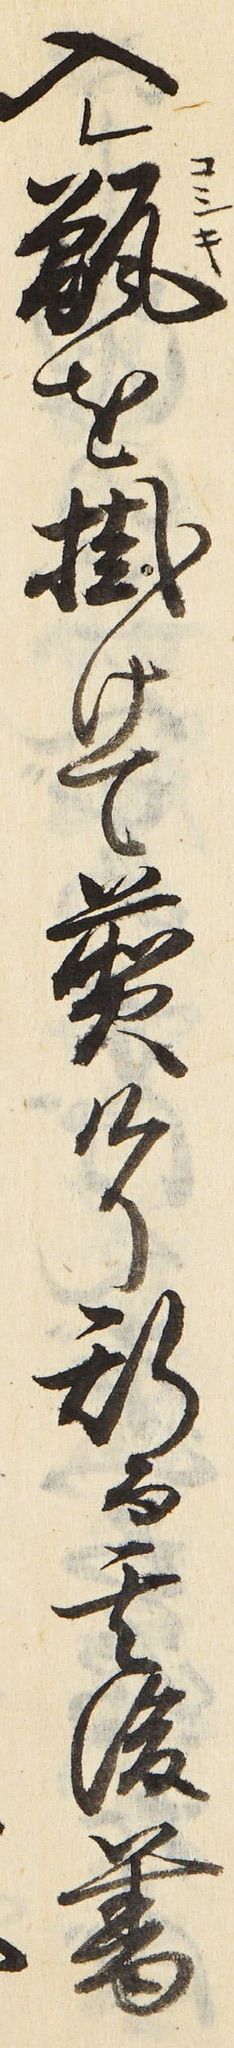入れ甑を掛けて煎けり斯而其後暮
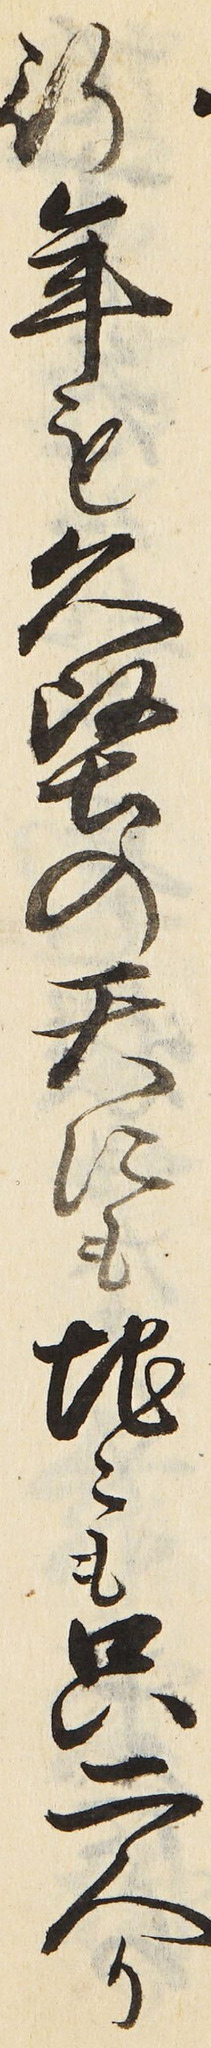行年も久堅の天にも地にも只二人り
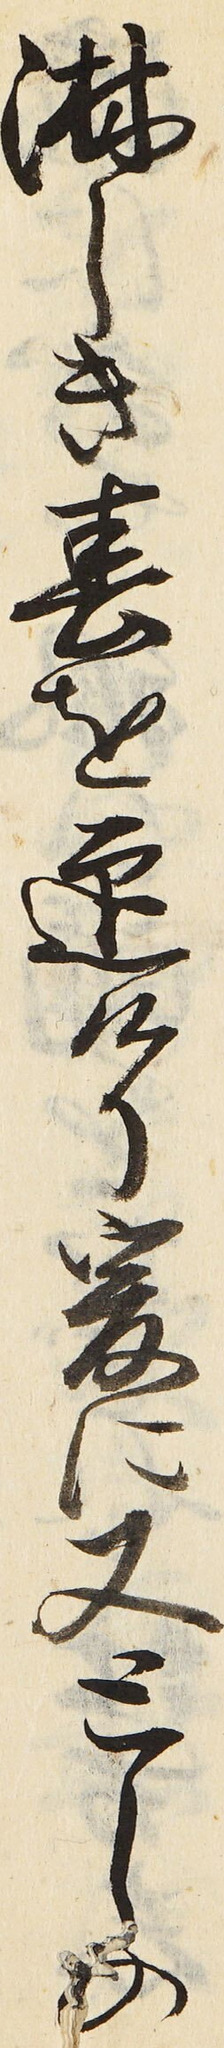淋しき春を迎けり爰に又としの
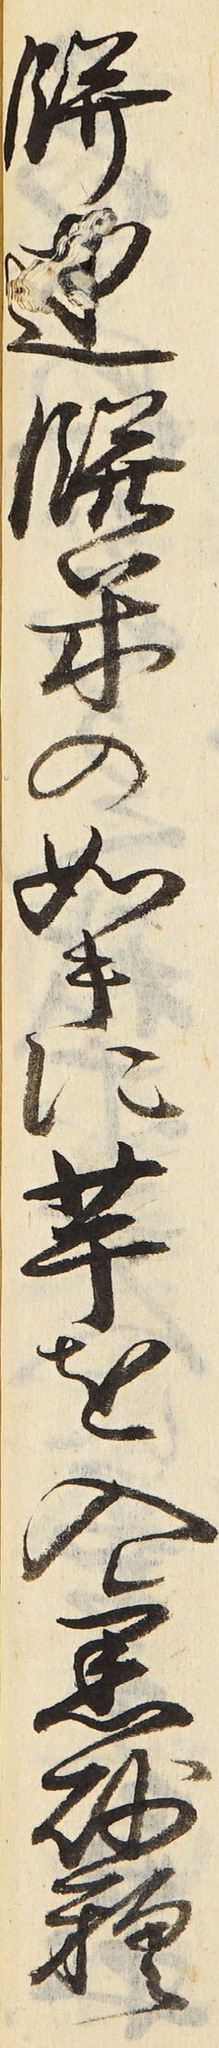餅迚餅米の如きに芋を入れ黒砂糖
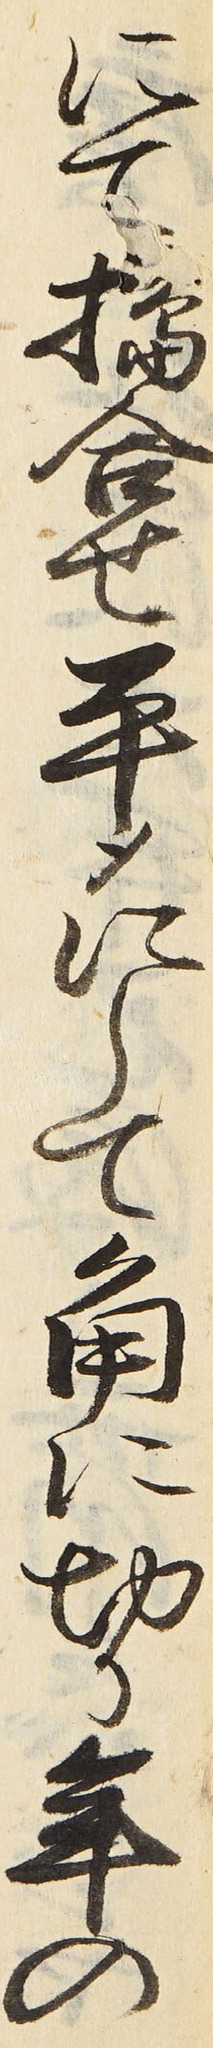にて尽く搗合せ平〆にして角に切り年の
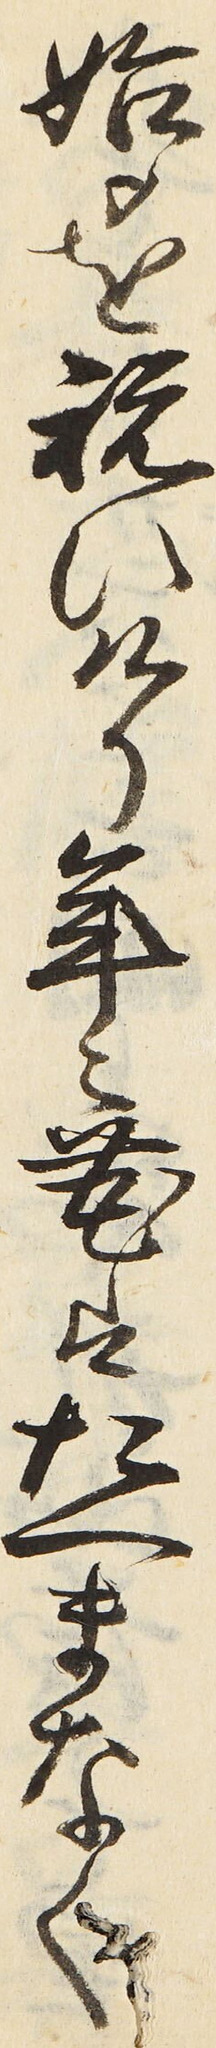始めを祝ひけり年々はたへまなく
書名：華夷九年録
